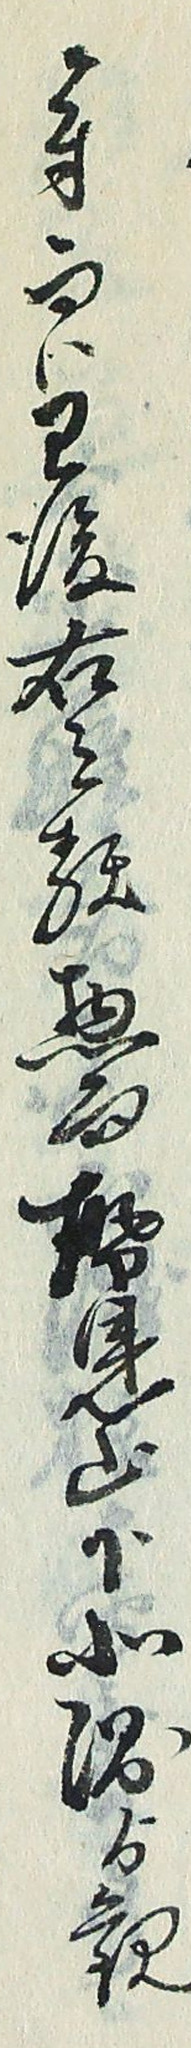ニ付而ハ已後右之趣惣而勢見山下北隅ゟ観
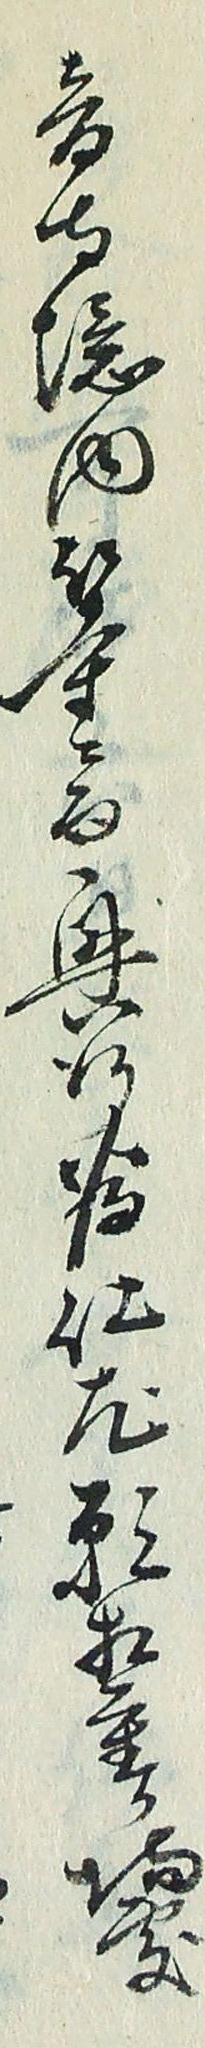音寺境内等ニ而興行為仕尤相重り場處
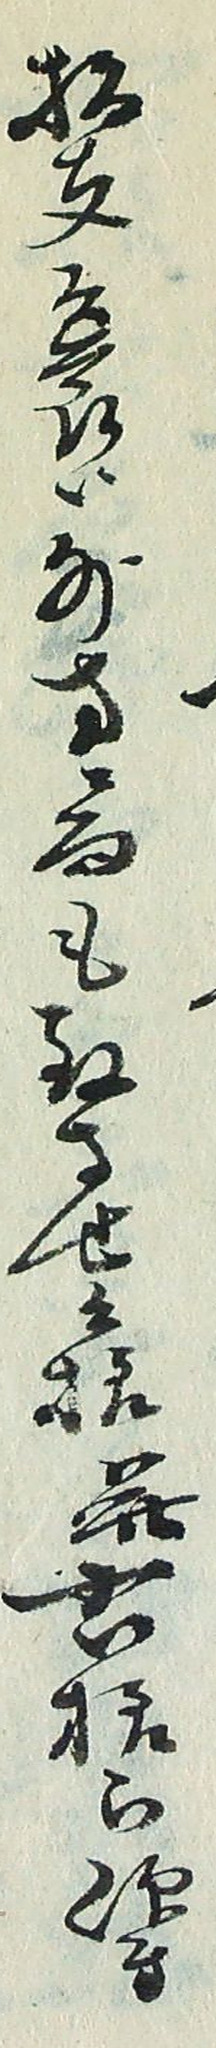指支候節ハ外方ニ而も致させ候様幷右様被仰付
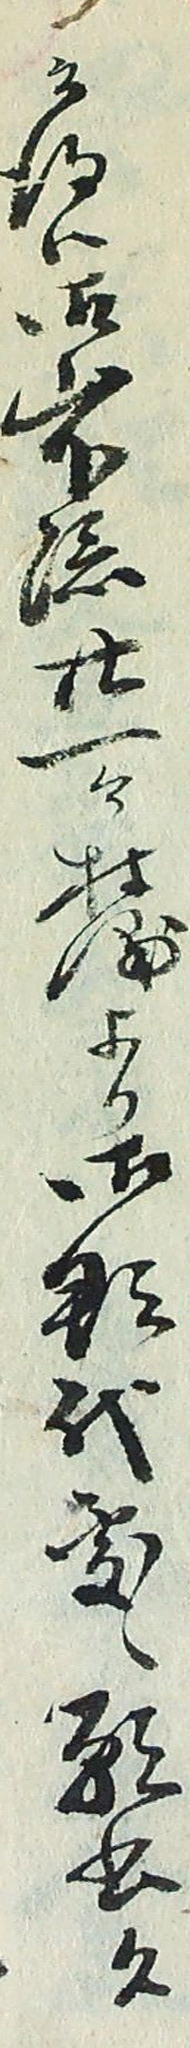候得ハ御山下諸廿一ケ村浦より御郡代處へ願出候
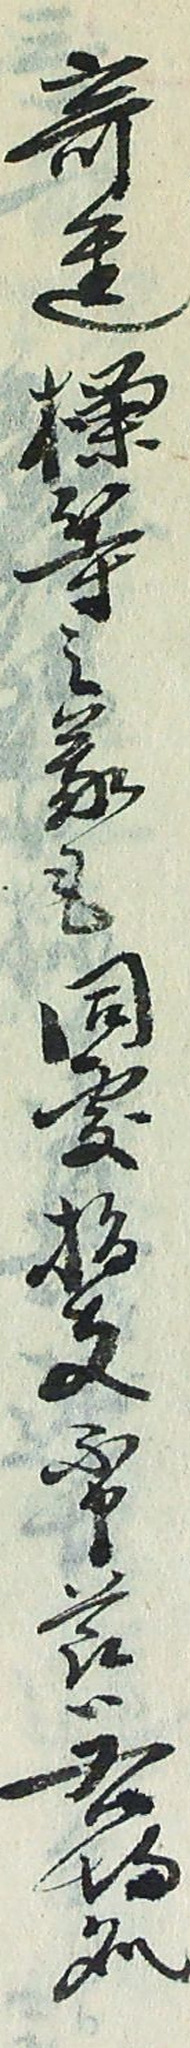寄進操等之義も同處指支不申節ハ右場処
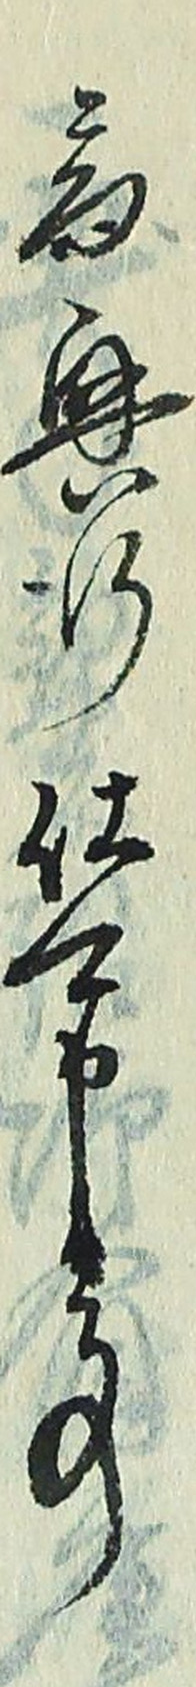ニ而興行仕可申事
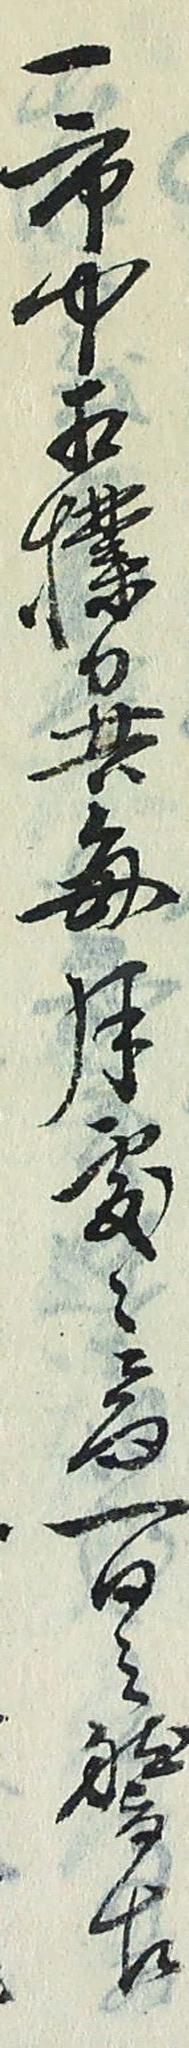一市中相撲力共毎月處々ニ而一日之稽古
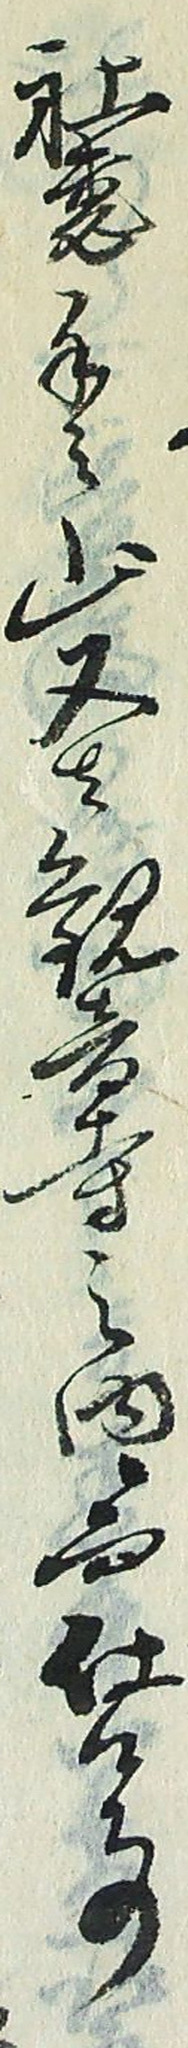社裏手之山又者観音寺之内ニ而仕候事
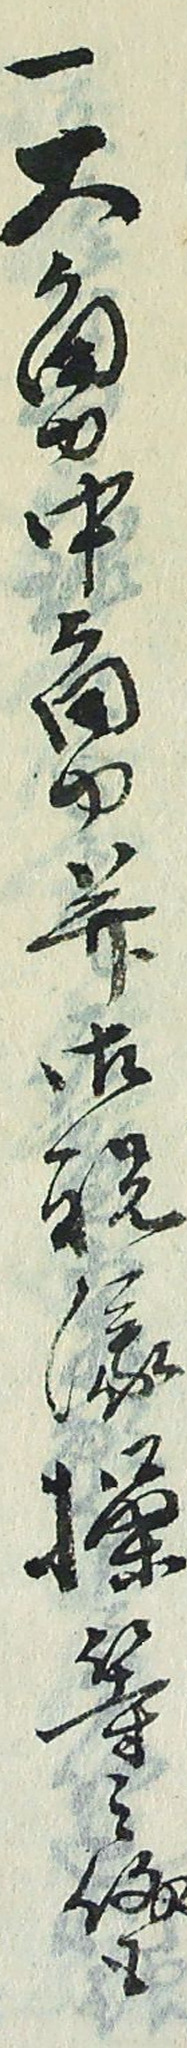一大角力中角力幷御祝儀操等之儀も
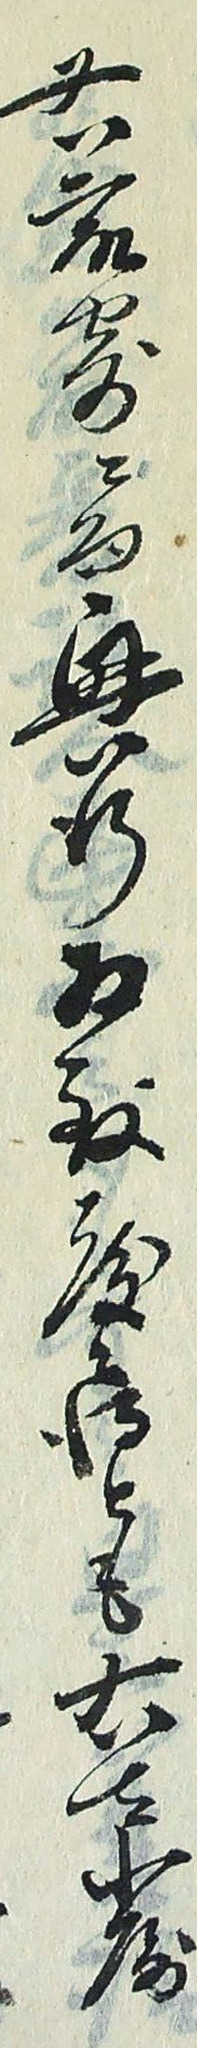右最寄ニ而興行為致度候得とも右者小屋
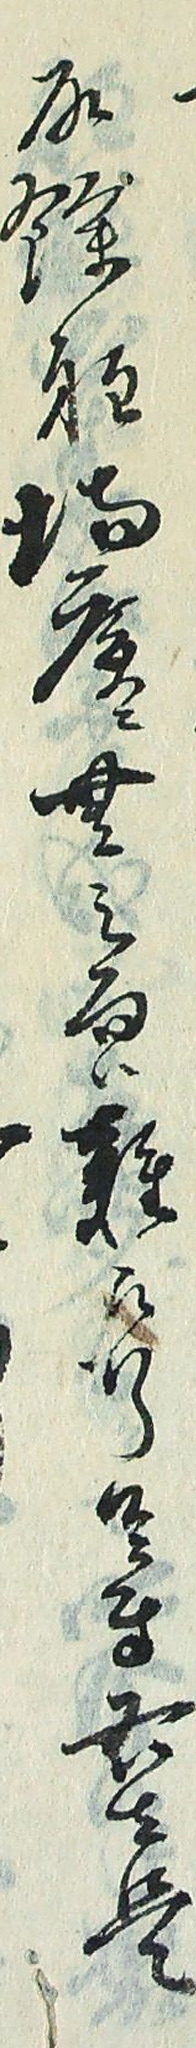取餘程場廣ニ無之而ハ難取行候ニ付右者是
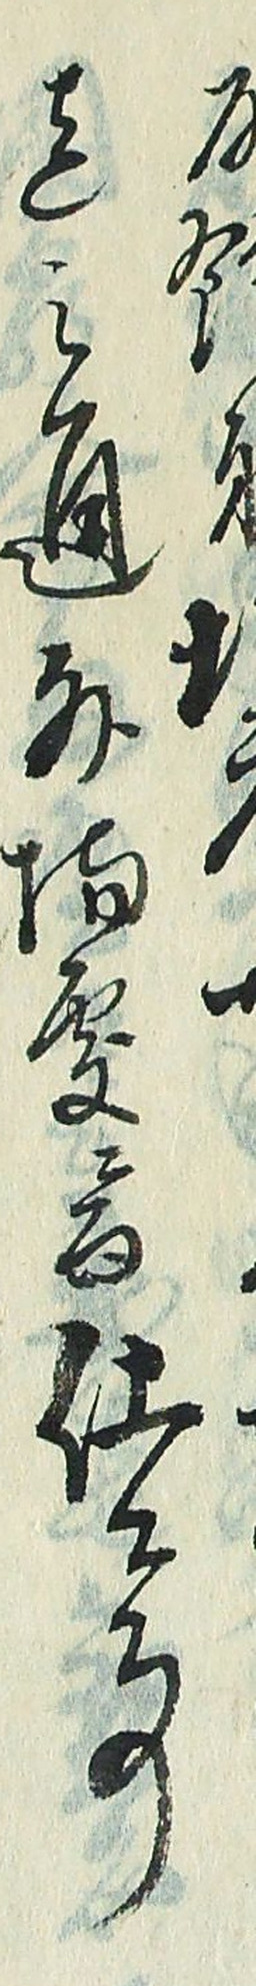迄之通外場處ニ而仕候事
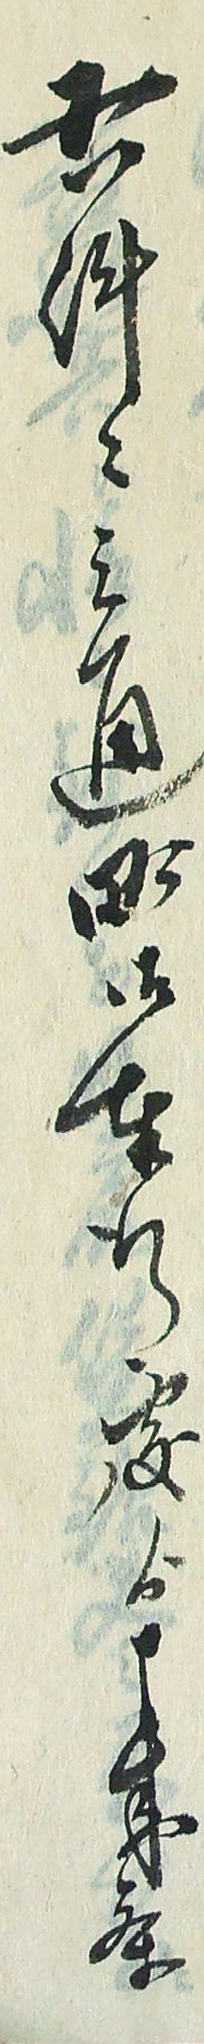右件々之通町御奉行處ゟ申来候条

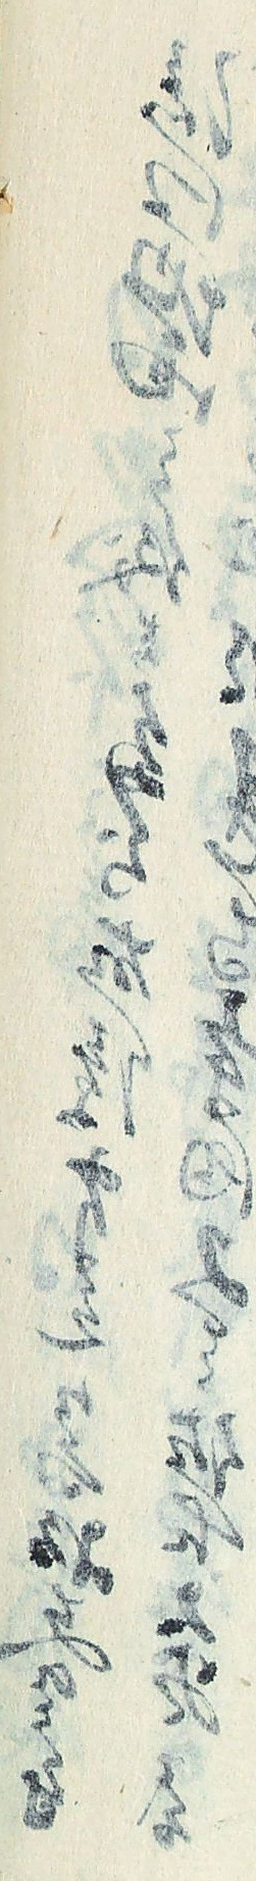十一月廿六日
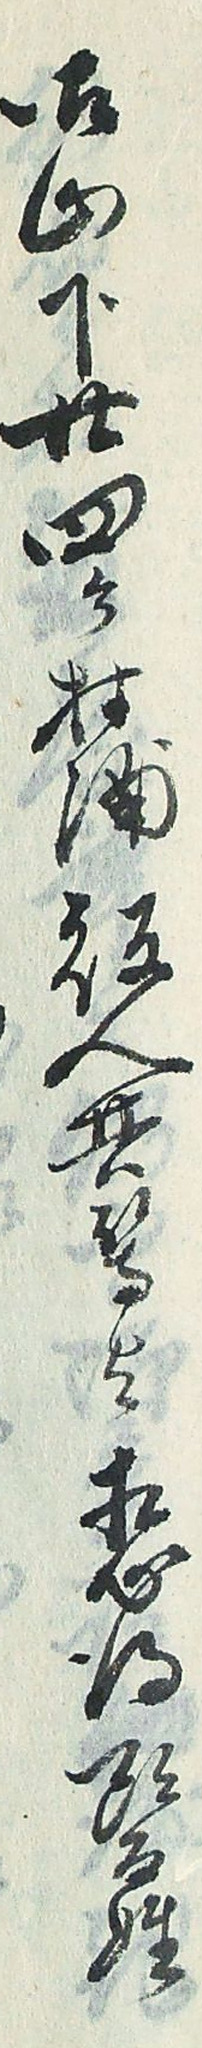御山下廿四ケ村浦役人共篤と相心得頭百姓
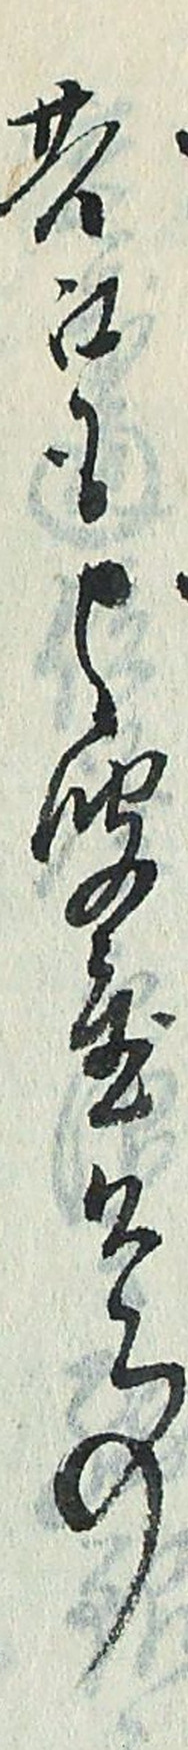共江も申聞置候事
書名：諸御趣意書并御下知向之写
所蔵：鳴門教育大学 Naruto University of Education
